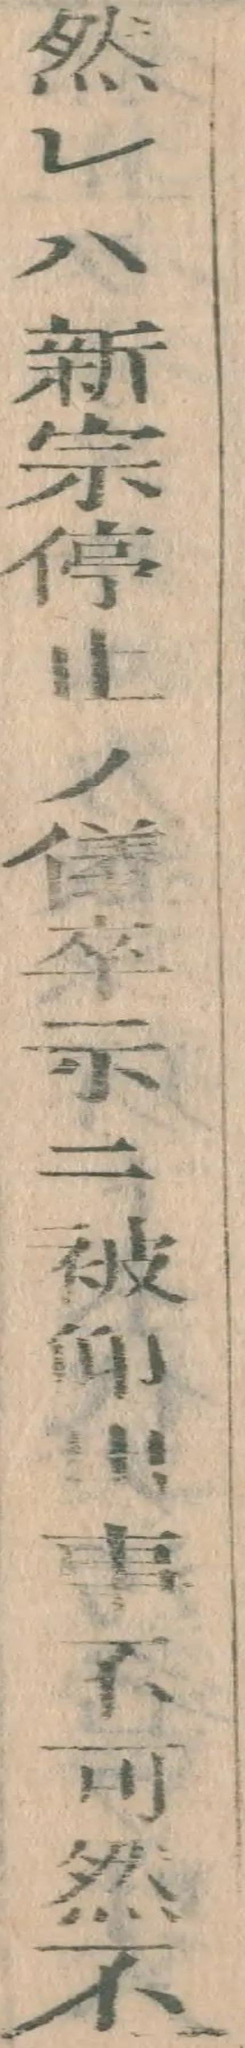然レハ新宗停止ノ儀卒示ニ被仰出事不可然不
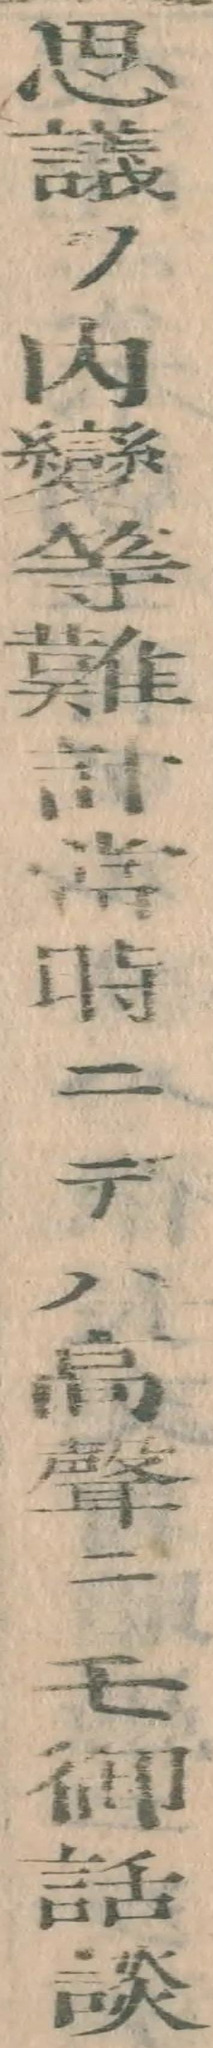思議ノ内変等難計当時ニテハ高声ニモ御話談
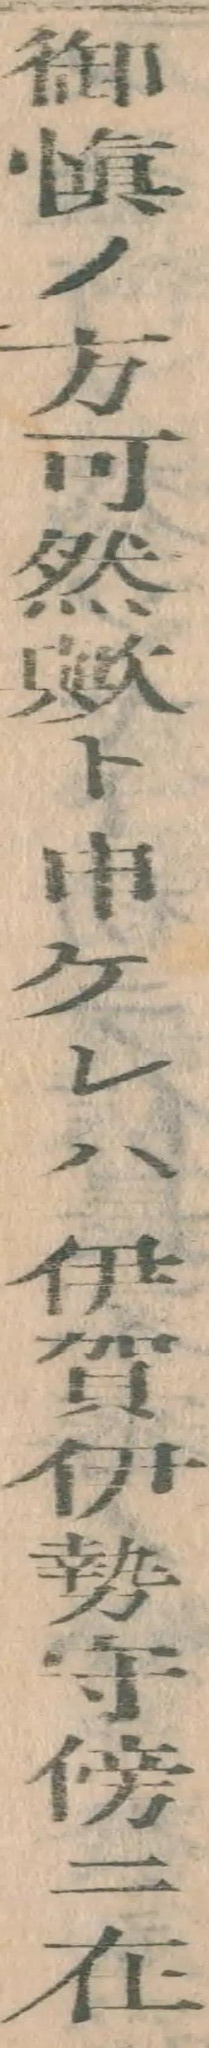御慎ノ方可燃歟ト申ケレハ伊賀伊勢守傍ニ在
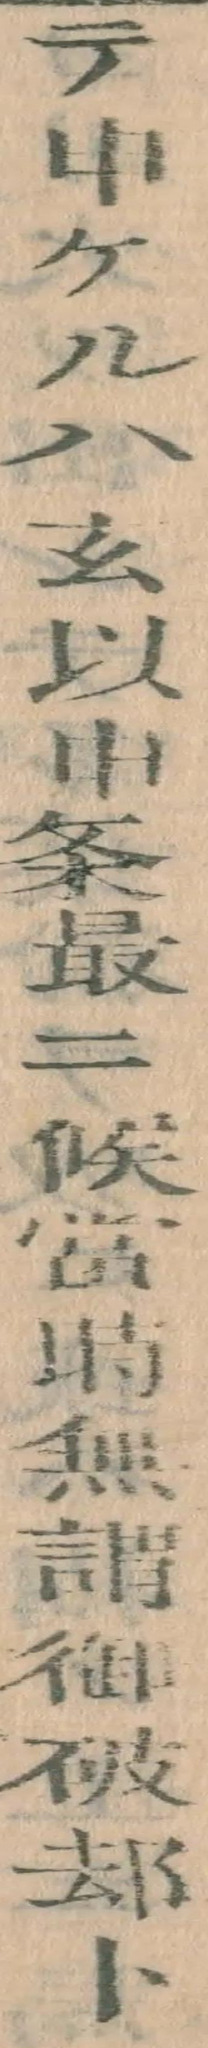テ申ケルハ玄以申条最ニ候当時無謂御破却ト
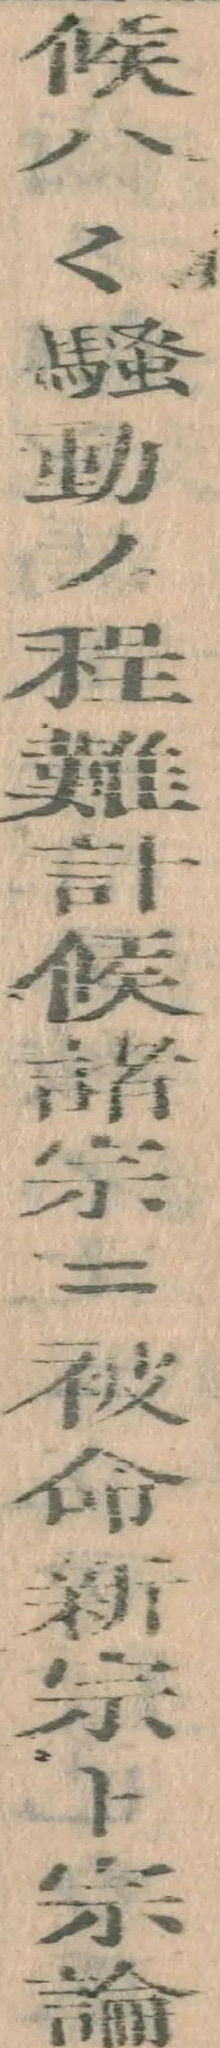候ハ〱騒動ノ程難計候諸宗ニ被命新宗ト宗論
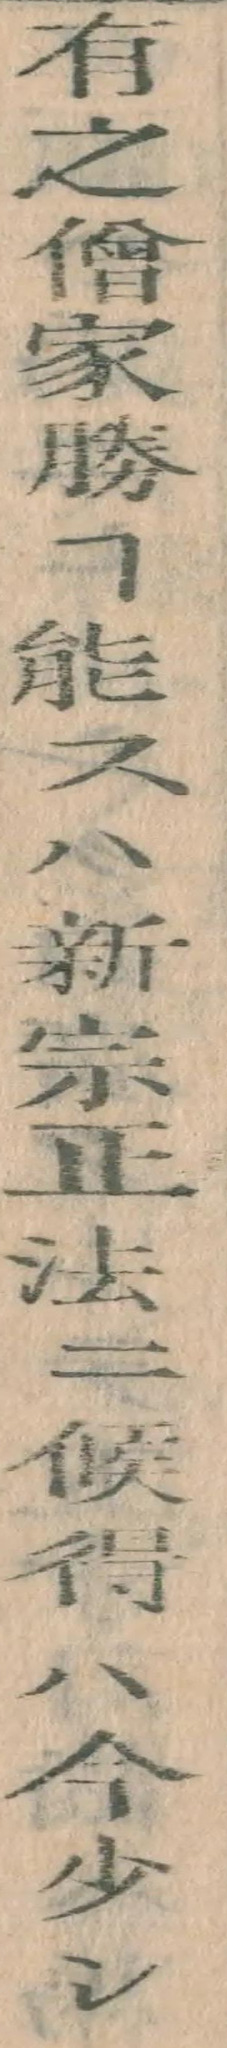有之僧家勝ヿ能スハ新宗正法ニ候得ハ今少シ
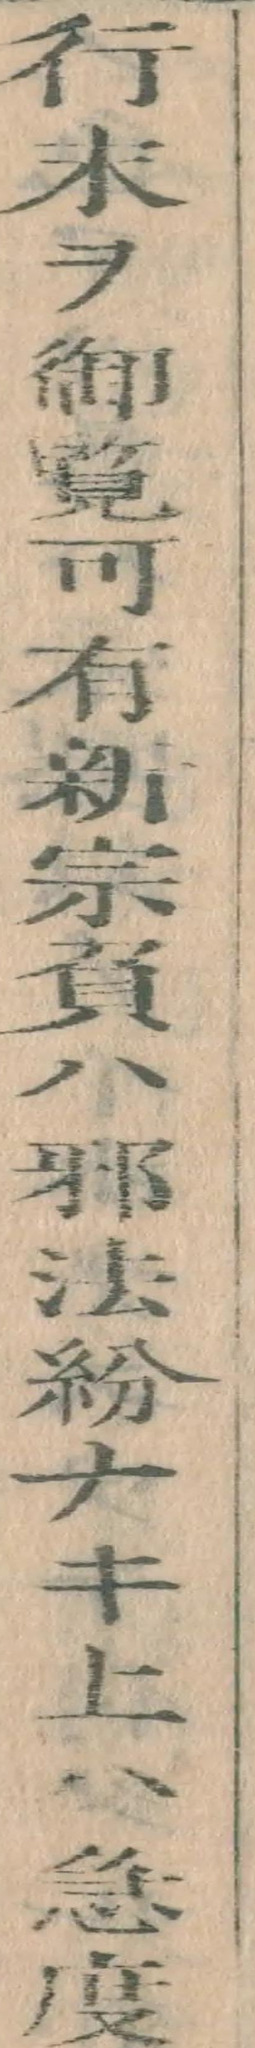行末ヲ御覧可有新宗負ハ邪法紛ナキ上ハ急度
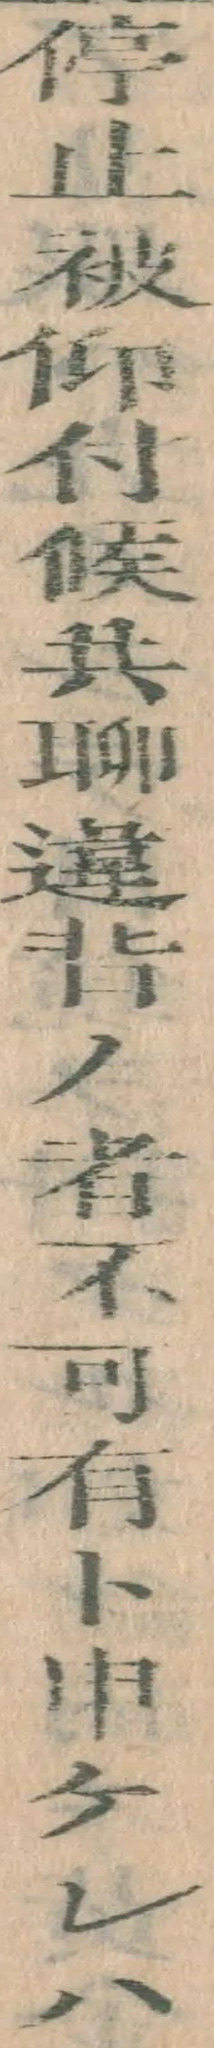停止被仰付候共聊違背ノ者不可有ト申ケレハ
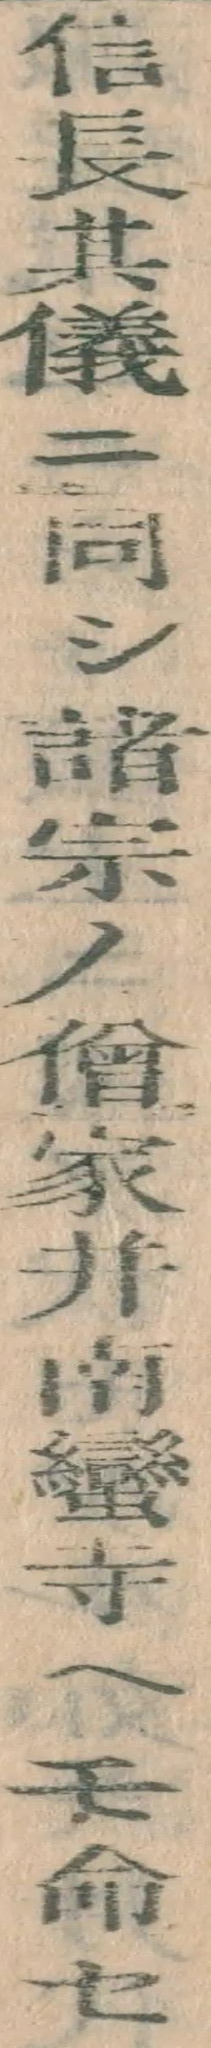信長其儀ニ同シ諸宗ノ僧家并南蛮寺ヘモ命セ
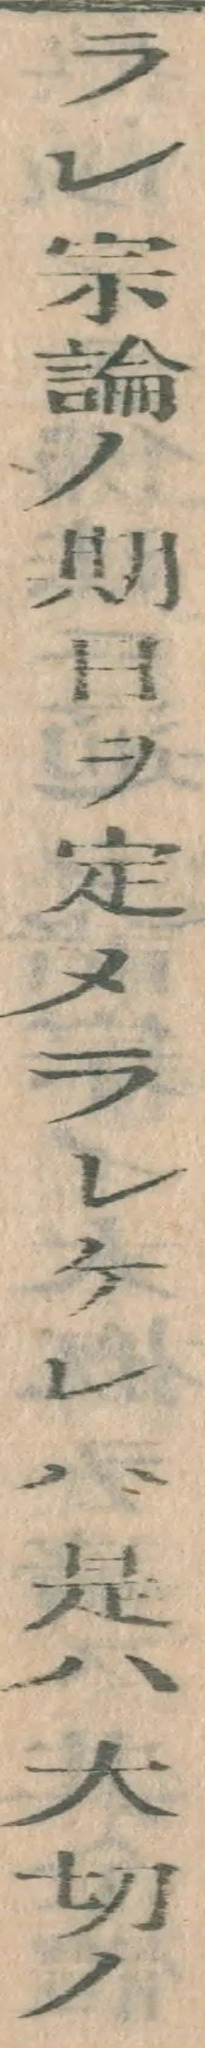ラレ宗論ノ期日ヲ定メラレケレハ是ハ大切ノ
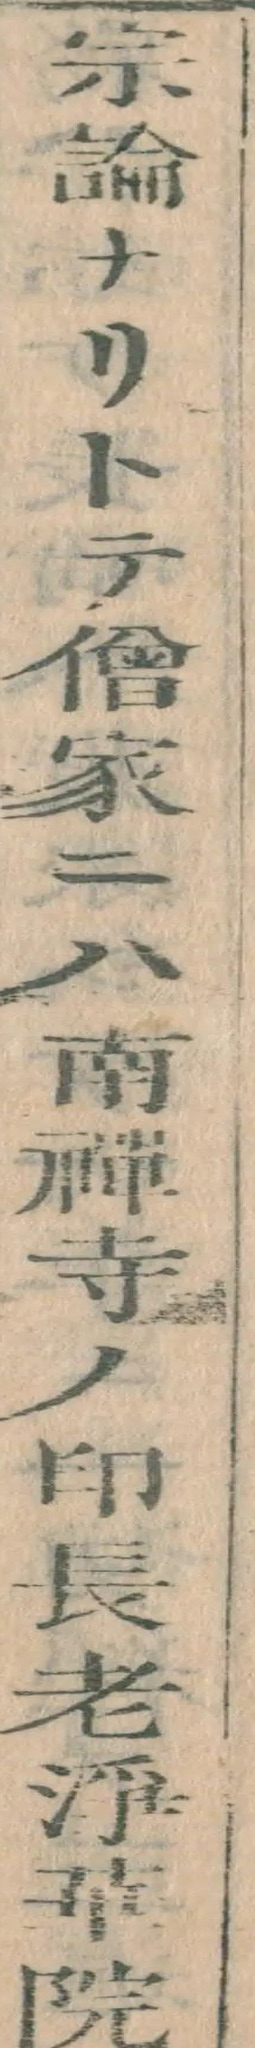宗論ナリトテ僧家ニハ南禅寺ノ印長老浄華院
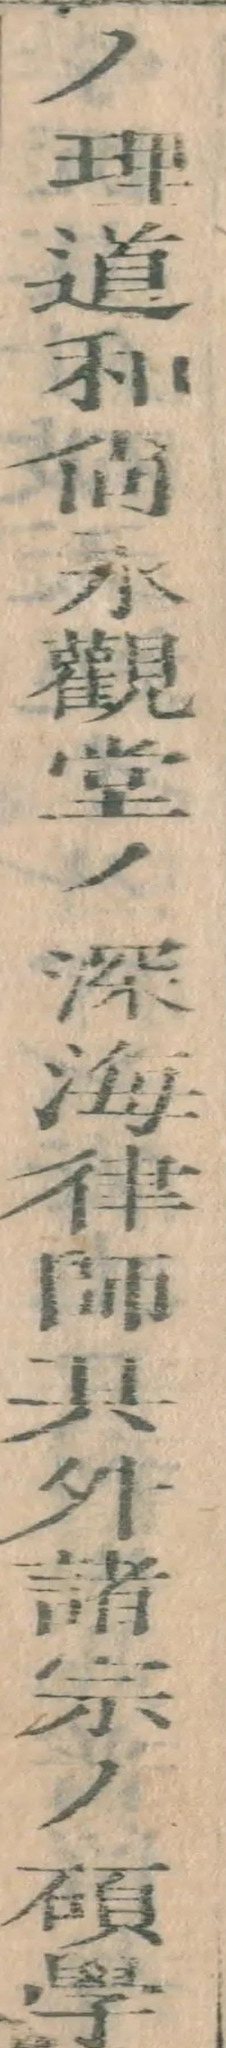ノ理道和尚永観堂ノ深海律師其外諸宗ノ碩学
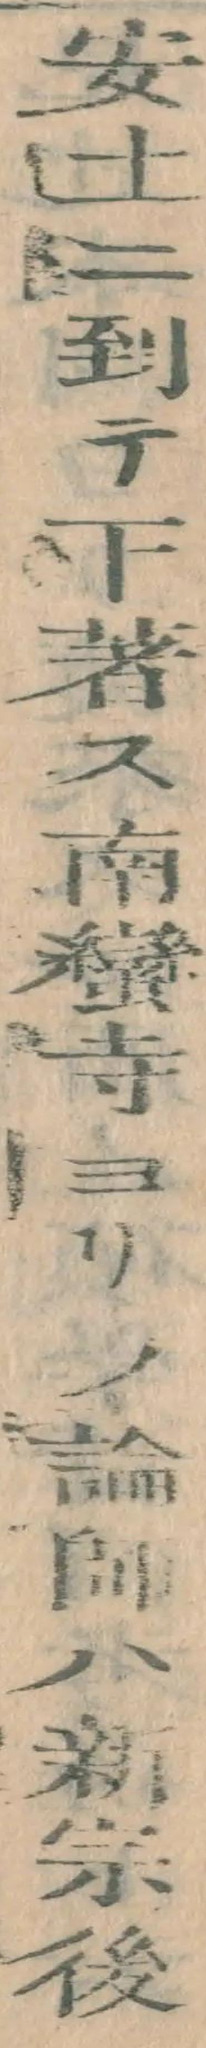安土ニ到テ下著ス南蛮寺ヨリノ論師ハ新宗後

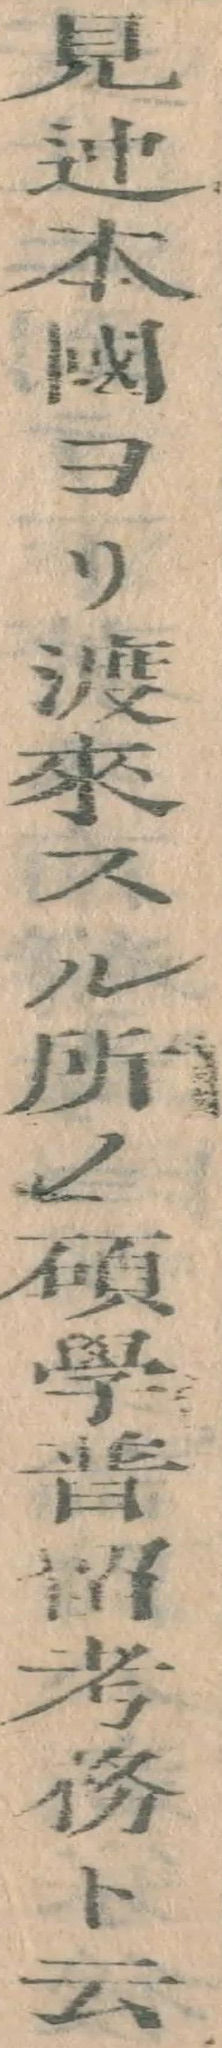見迚本国ヨリ渡来スル所ノ碩学普留考務ト云
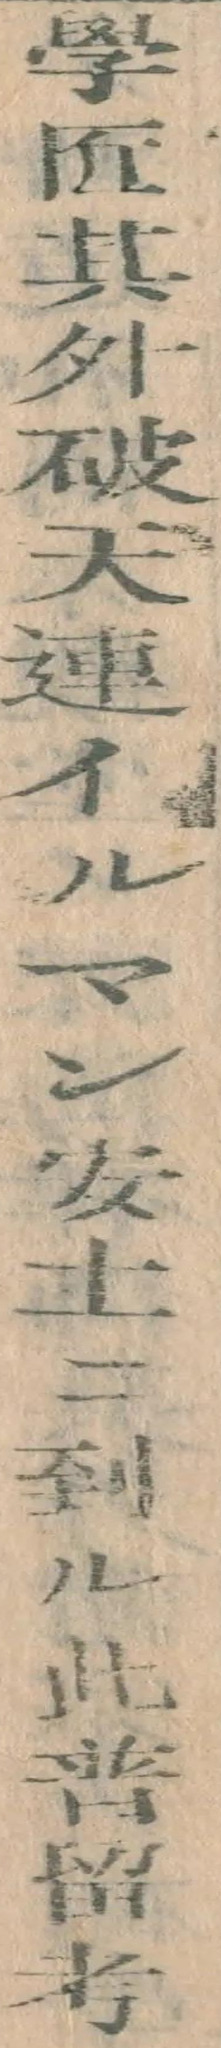学匠其外破天連イルマン安土ニ到ル此普留考
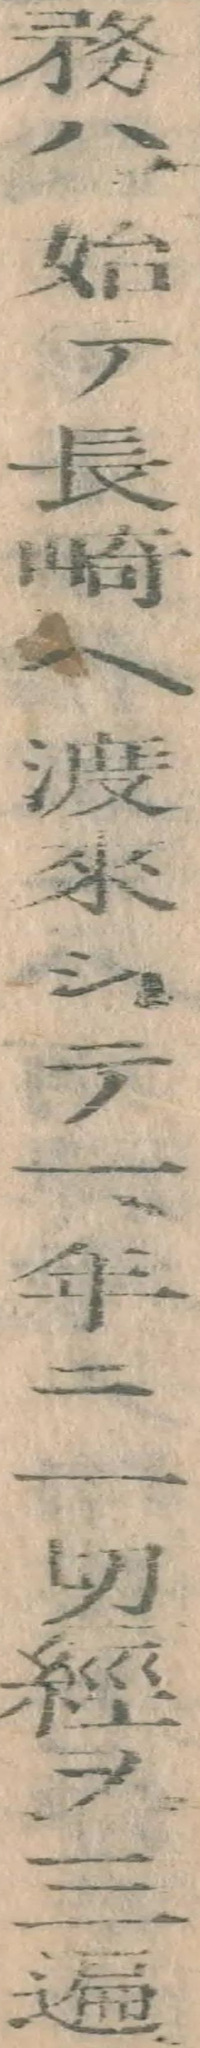務ハ始テ長崎ヘ渡来シテ一年ニ一切経ヲ三遍
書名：南蛮寺興廃記
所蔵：国立国会図書館 National Diet Library, JAPAN
